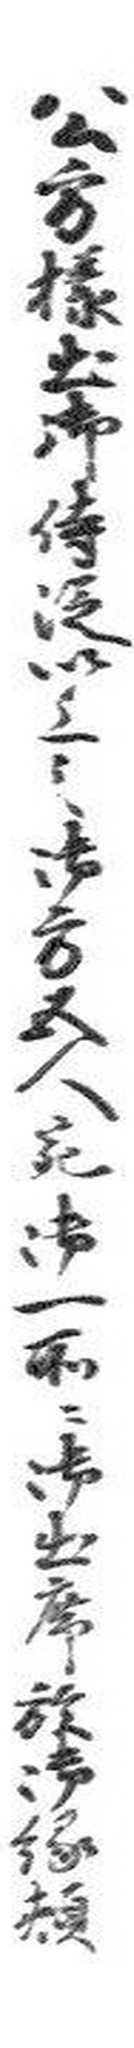公方様出御侍従以上之御方五人宛御一所ニ御出席於御縁頬
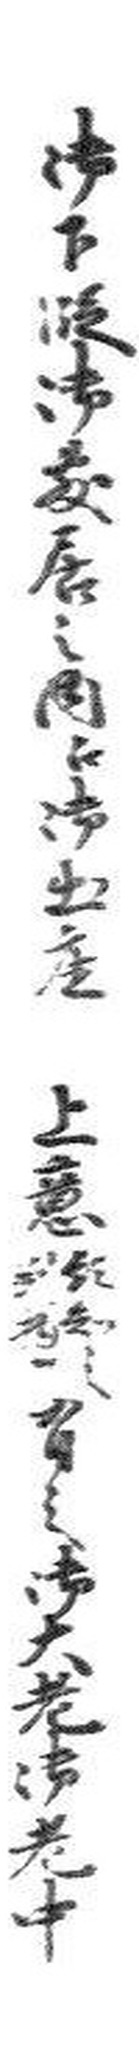御下段御敷居之内御出座上意領知之判物有之御大老御老中
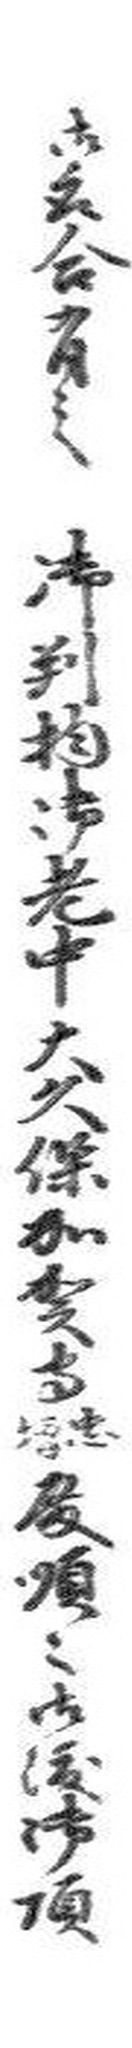御取合有之御判物御老中大久保加賀守忠増殿順々御渡御頂
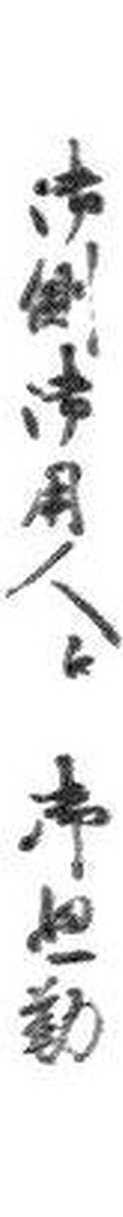御側御用人江御廻勤

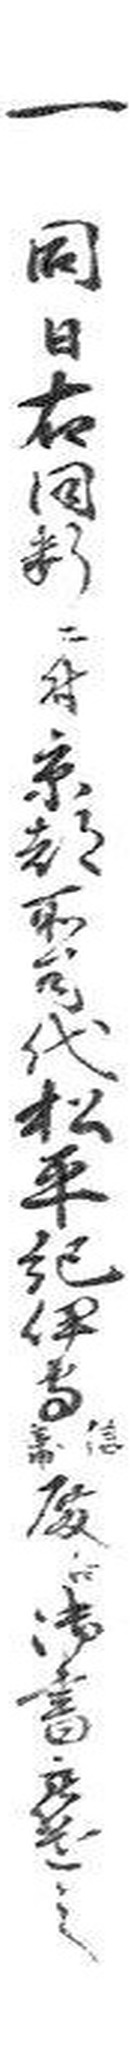一同日右同断ニ付京都所司代松平紀伊之信庸殿江御書被遣之
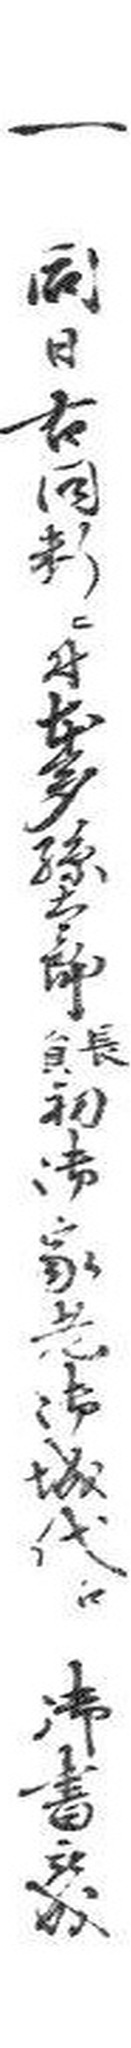一同日右同断ニ付本多孫太郎長員初御家老御城代江御書被成
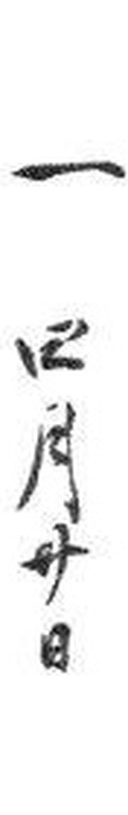一四月廿日
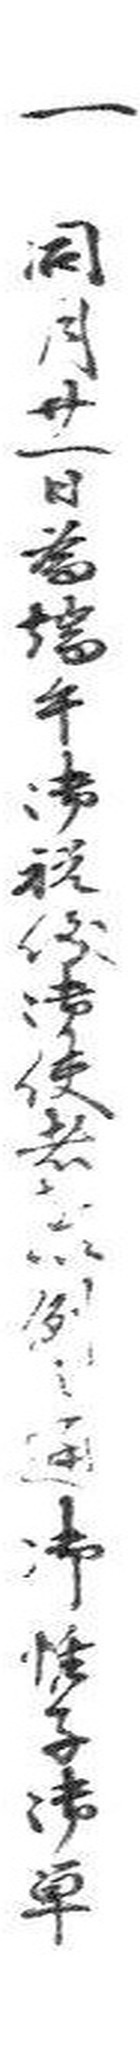一同月廿一日為端午御祝儀御使者を以例之通御帷子御単
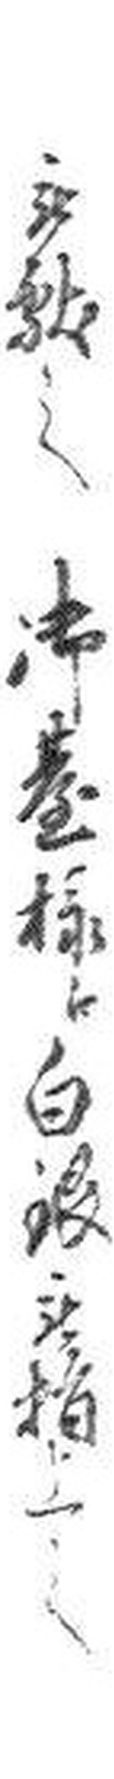被献之御台様江白銀被指上之
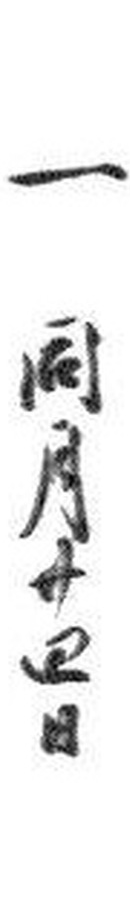一同月二十四日
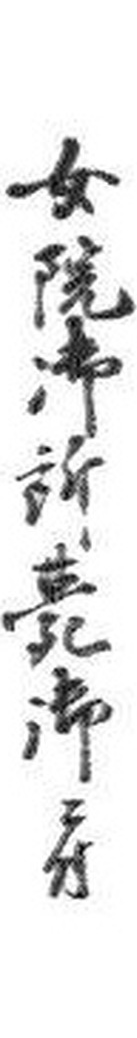女院御所薨御ニ付
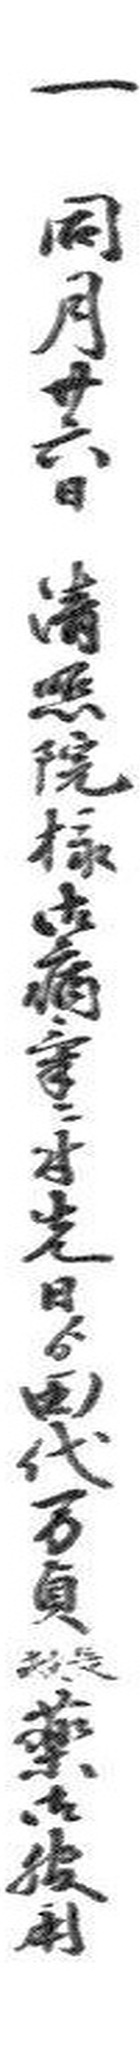一同月廿六日清照院様御病気ニ付先日ゟ田代万貞薬御服用
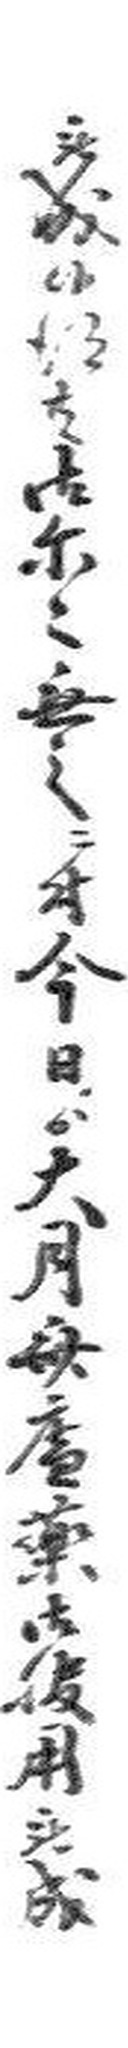被成候得共御尓々無之ニ付今日ゟ大月斎庵薬御服用被成
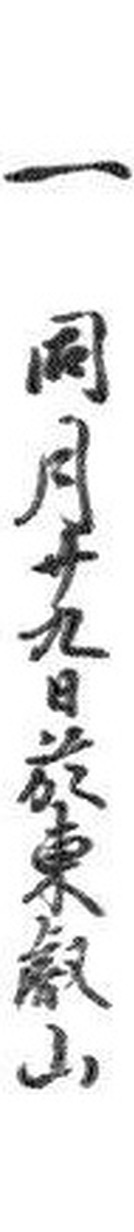一同月廿九日於東叡山
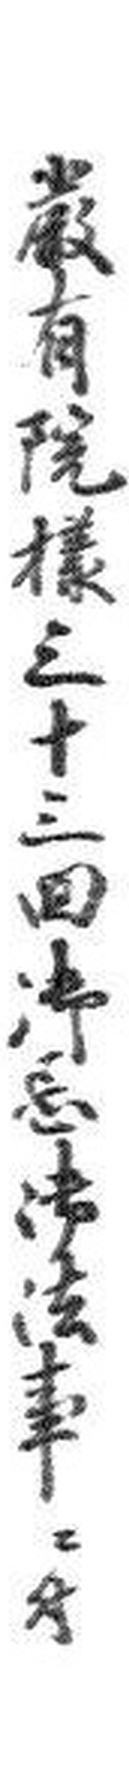厳有院様三十三回御忌御法事ニ付
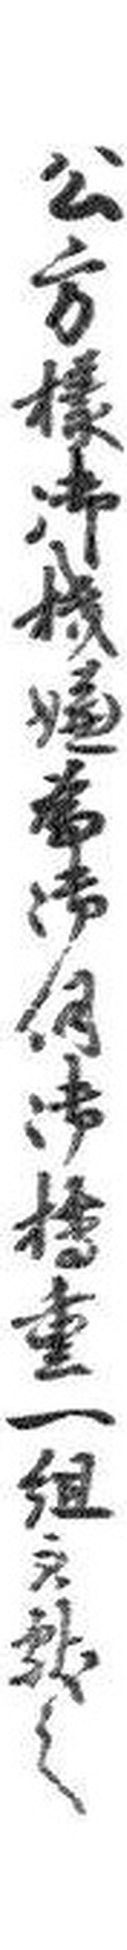公方様御機嫌為御伺御桧重一組被献之
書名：家譜 二十九 吉邦公 従正徳二年到正徳三年
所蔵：福井県文書館 Fukui Prefectural Archives
